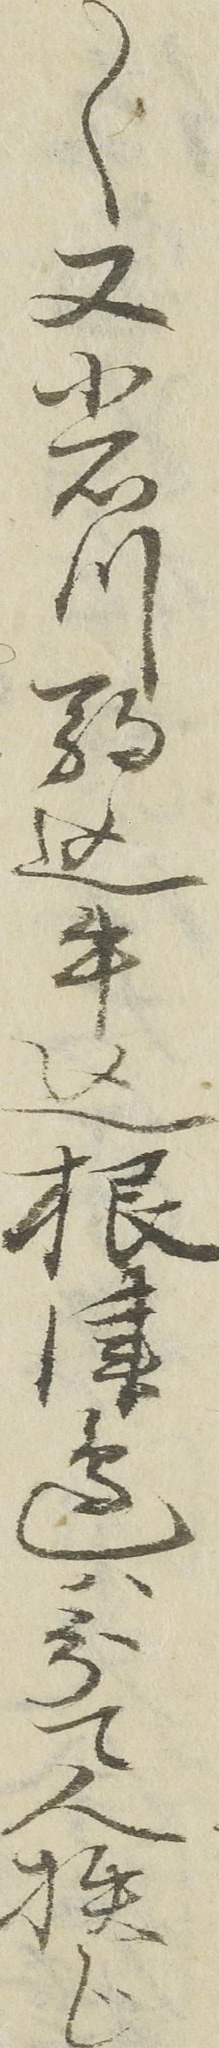く又小石川駒込牛込根津辺ハ分て人損じ
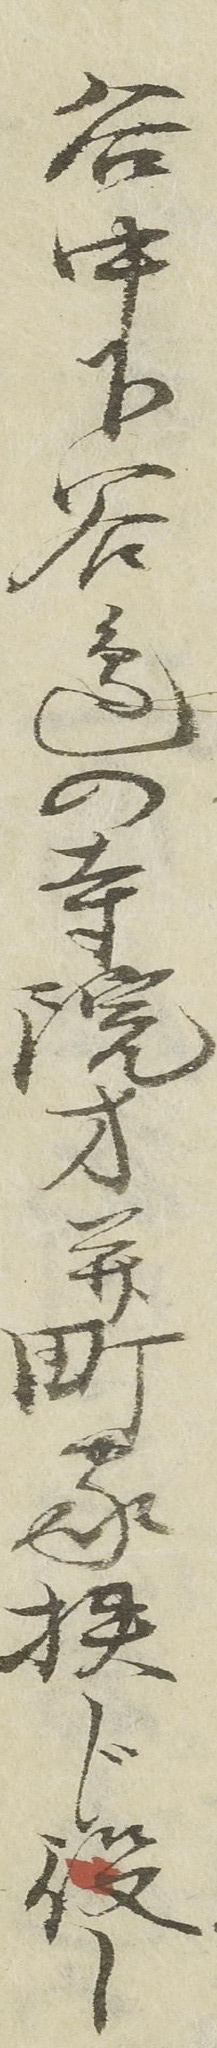谷中下谷辺の寺院方并町家損じ役し
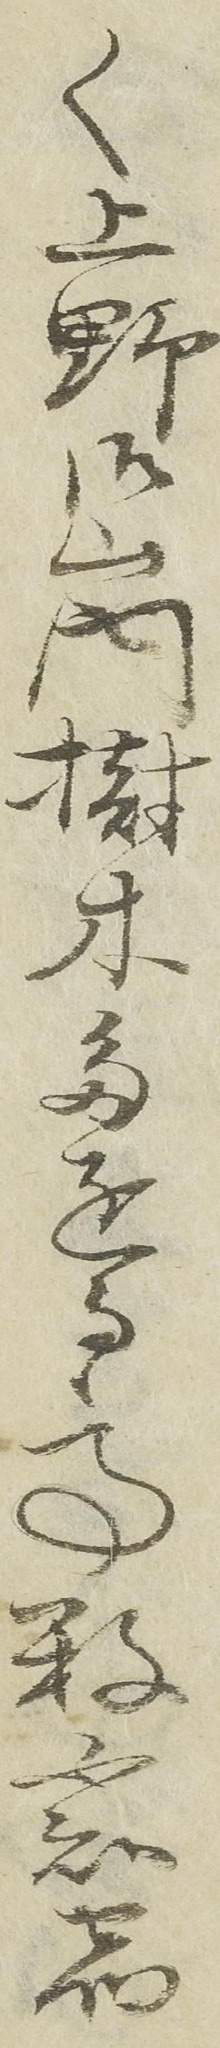く上野御山内樹木多をるゝ事数不知宿
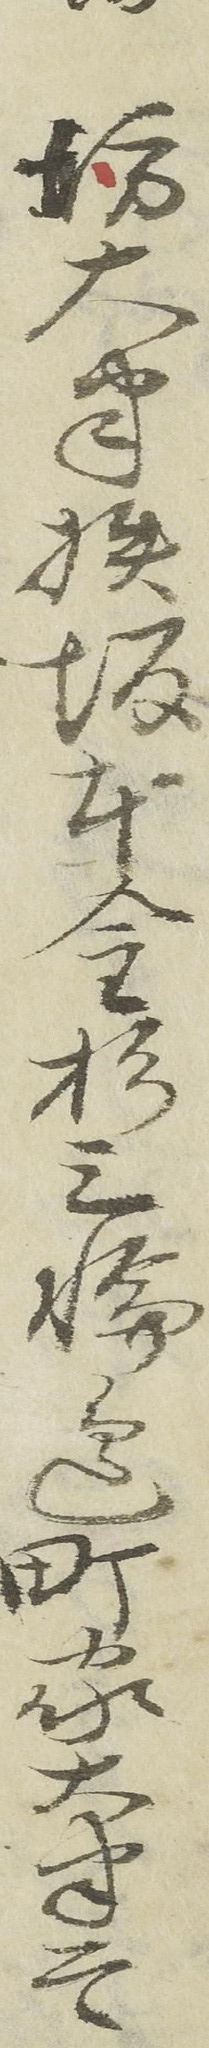坊大半損坂本金杉三輪辺町家大半そ
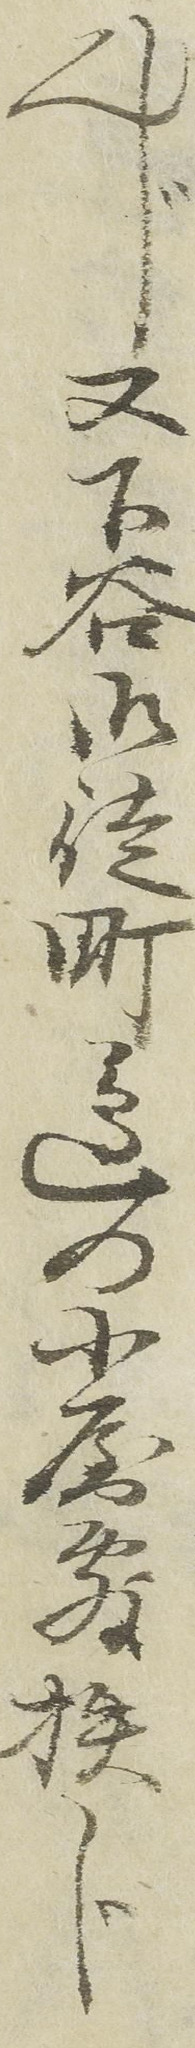んじ又下谷御徒町辺の小屋敷損じ

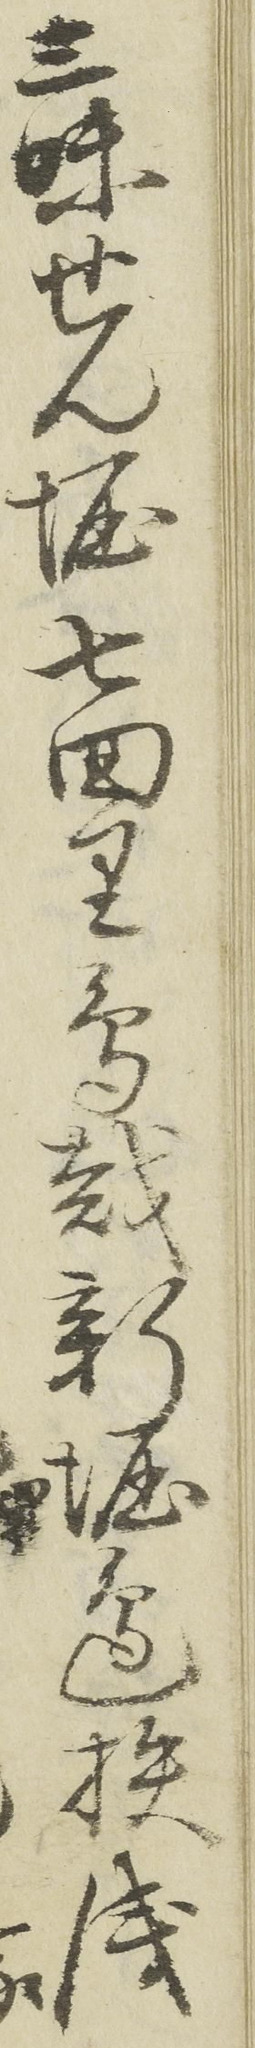三味せん堀七回り鳥越新堀辺損浅
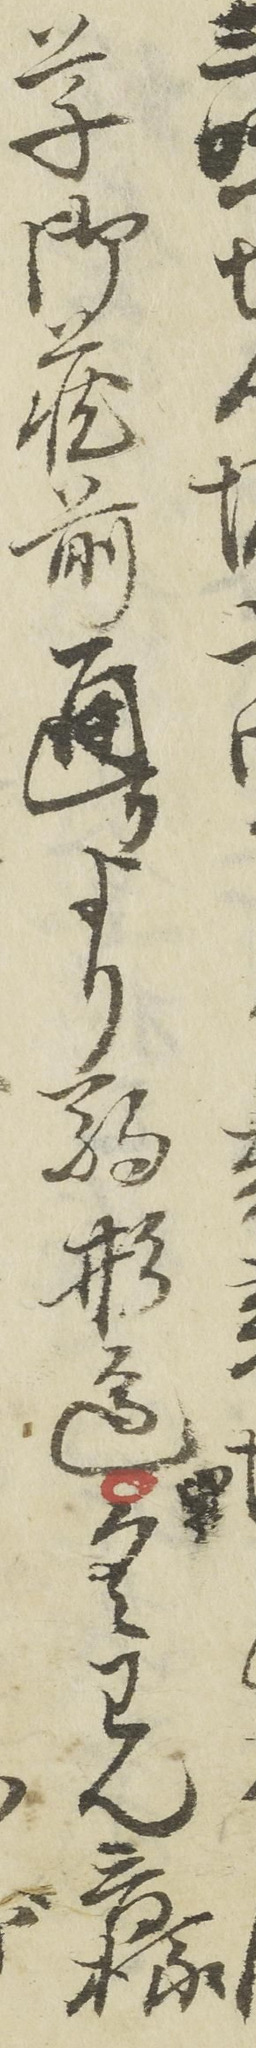草御蔵前通りより駒形辺くわん音様
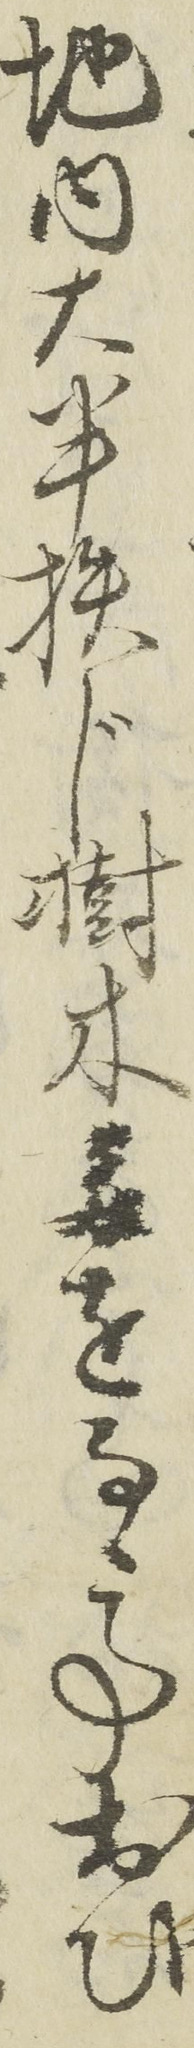地内大半損じ樹木たをるゝ事おび
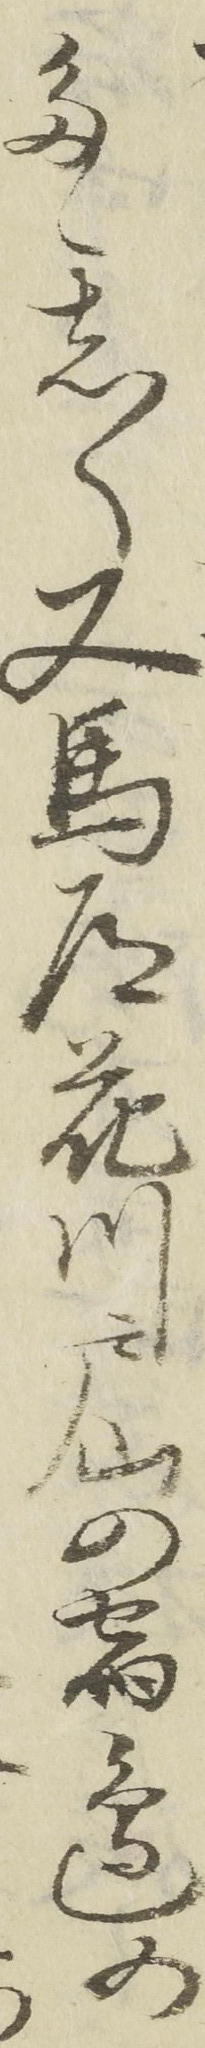たゝしく又馬道花川戸山の宿辺の
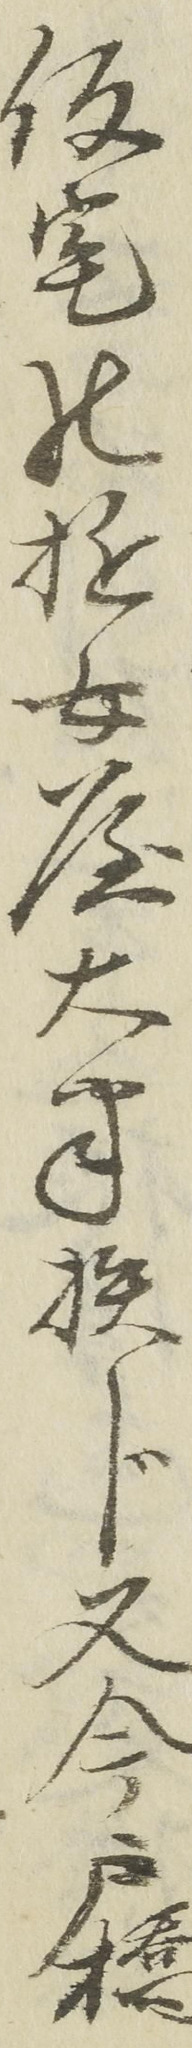仮宅の遊女屋大半損じ又今戸橋
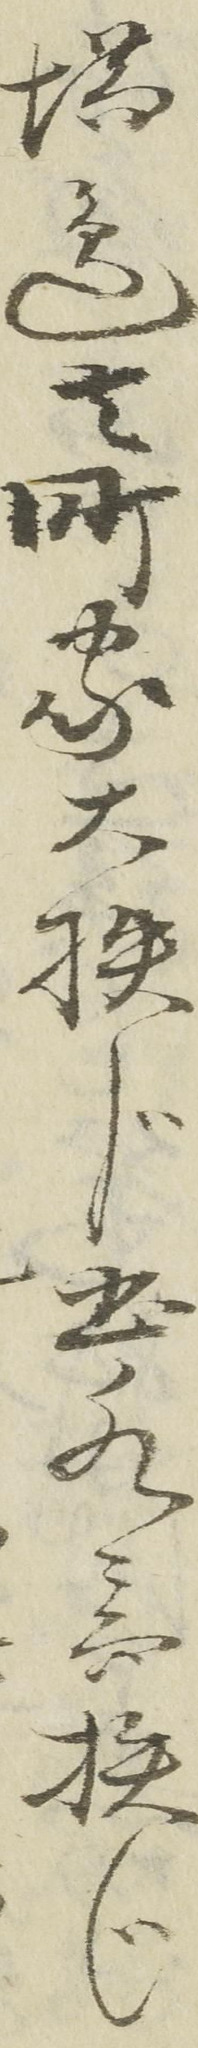端辺は町家大損じ出水ニ而損じ
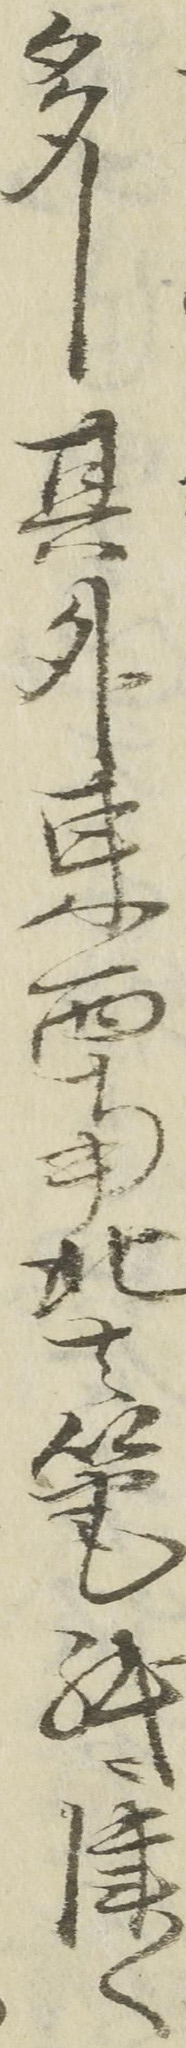多し其外東西南北は筆紙ニつく
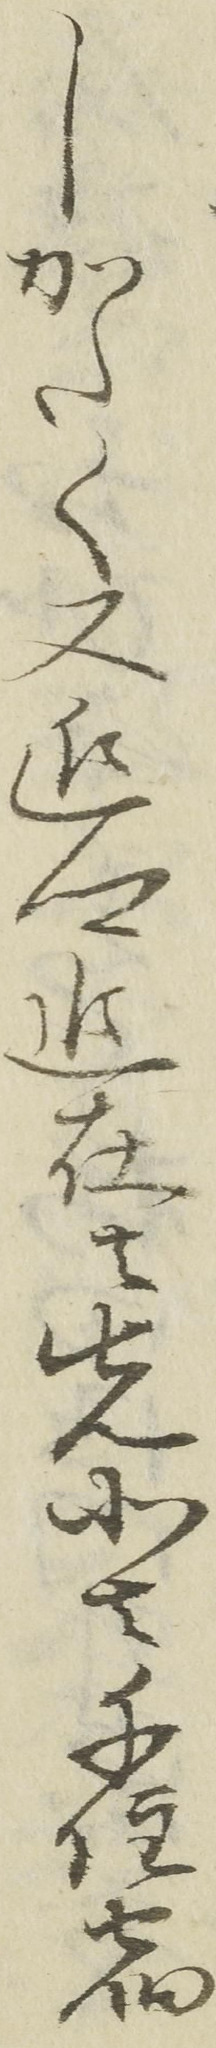しかたく又近郷近在ハ先北は千住宿
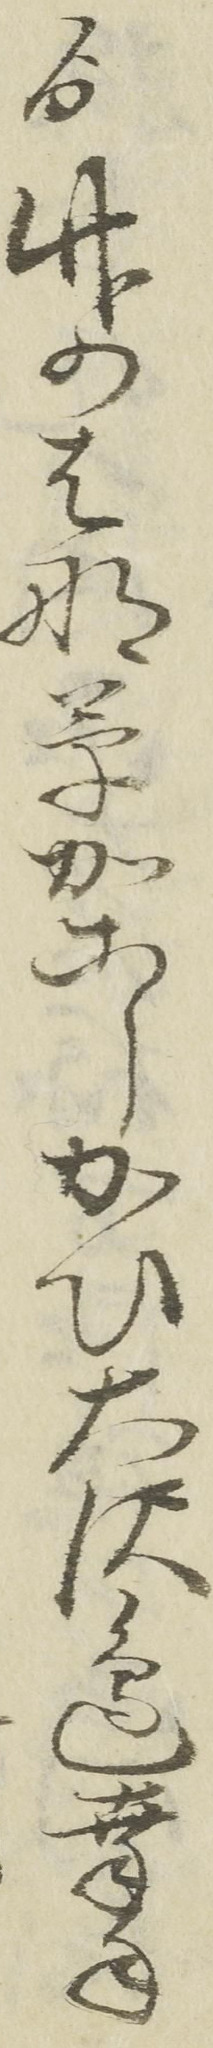ゟ此のはな草加こしかひ大沢辺幸手
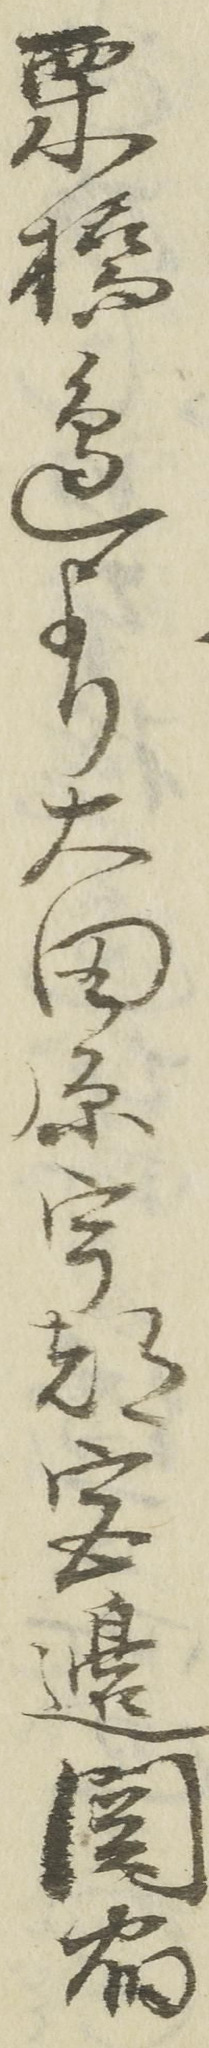栗橋辺より大田原宇都宮辺関宿
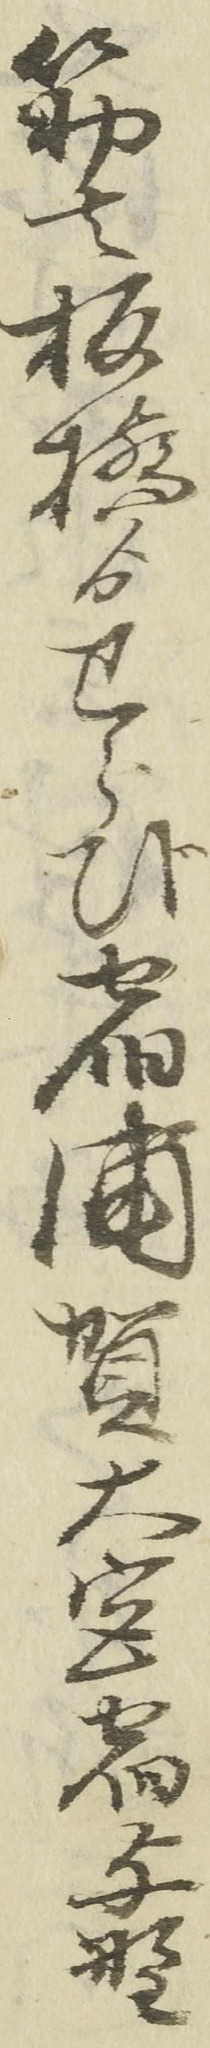筋は板橋ゟわらび宿浦賀大宮宿与野
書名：安政乙卯江戸大地震筆記　安政丙辰八月大阪大雷雨之記追加　安政三辰年七月松前辺大地震并八月大風雨記録
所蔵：東京大学地震研究所図書室 Earthquake Research Institute Library, The University of Tokyo, JAPAN
